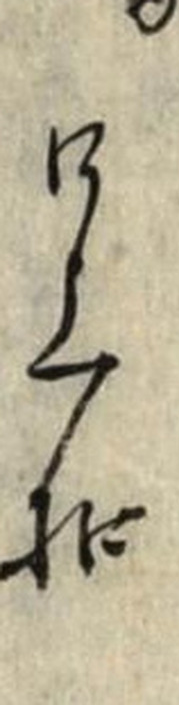口上扣
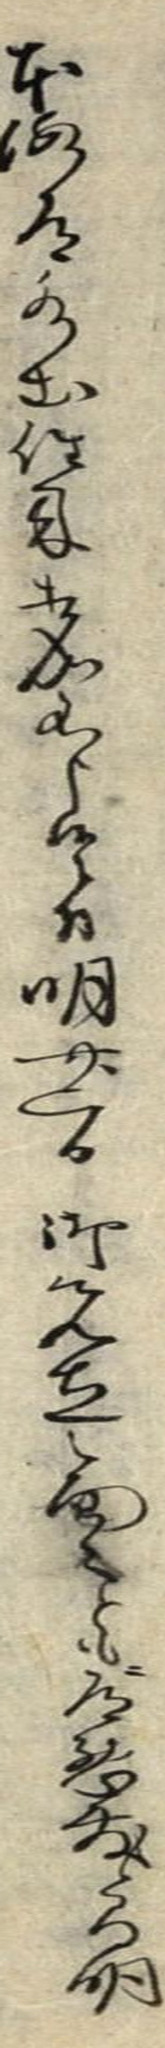本海道水出往来相成不申候に付明廿二日御先立之面々ともに道悪敷候間明
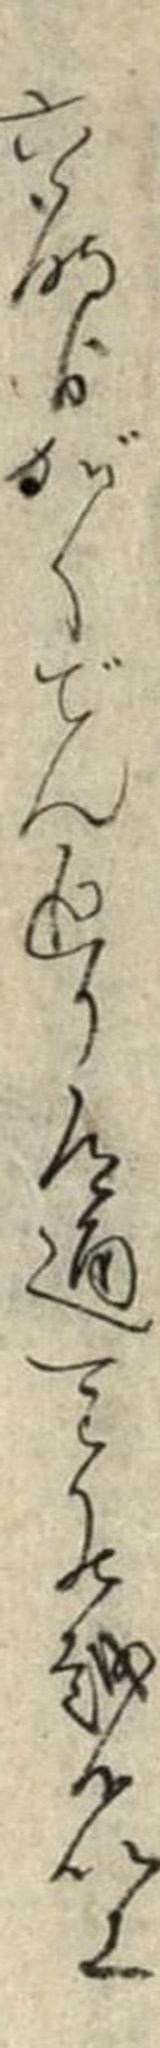六ツ時ゟがくでん廻り道通可被罷越候以上
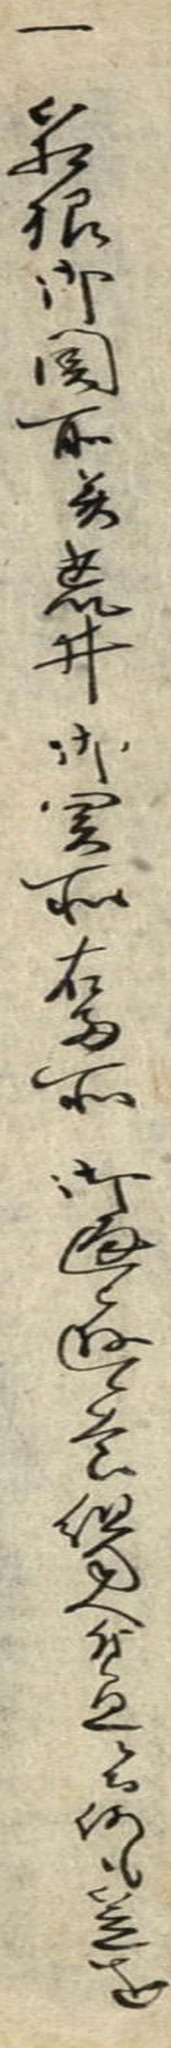一箱根御関所并荒井御関所右両所御通被遊候節組用人付置候て何も笠を
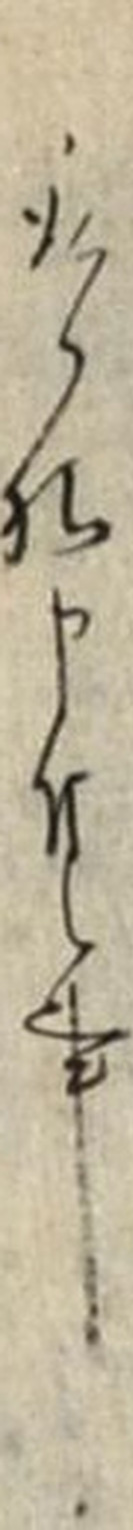取候様申付候事
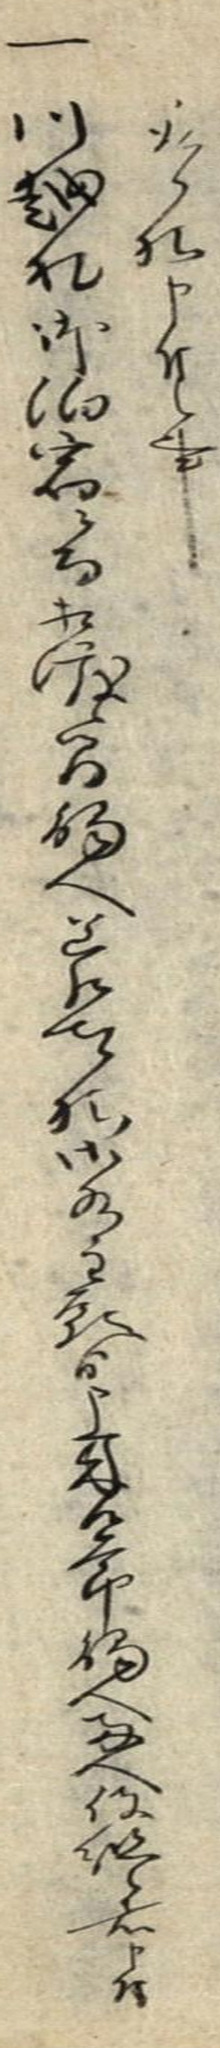一川越札御泊宿にて相渡候間触人差出候様御水主頭ゟ申来候節触人両人役組之者申付
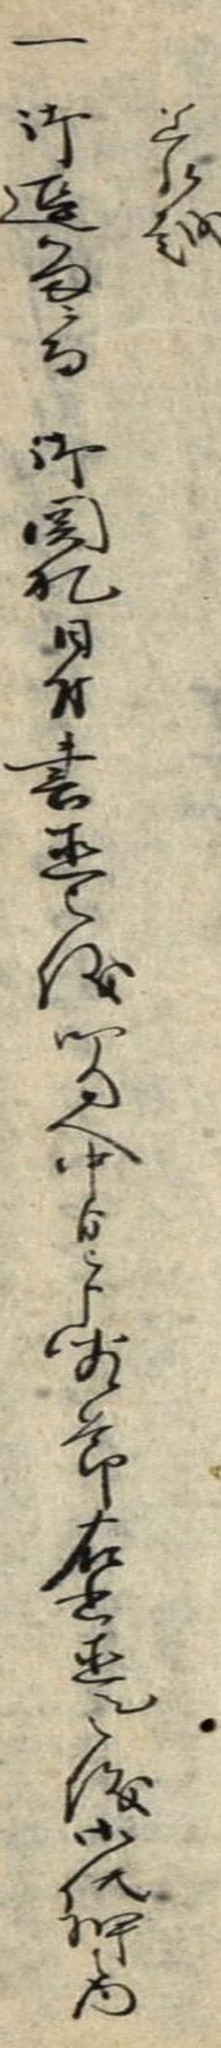一御逗留にて御関札目付書直之儀御用人中ゟ被申聞候節右書直し之儀御供押之内

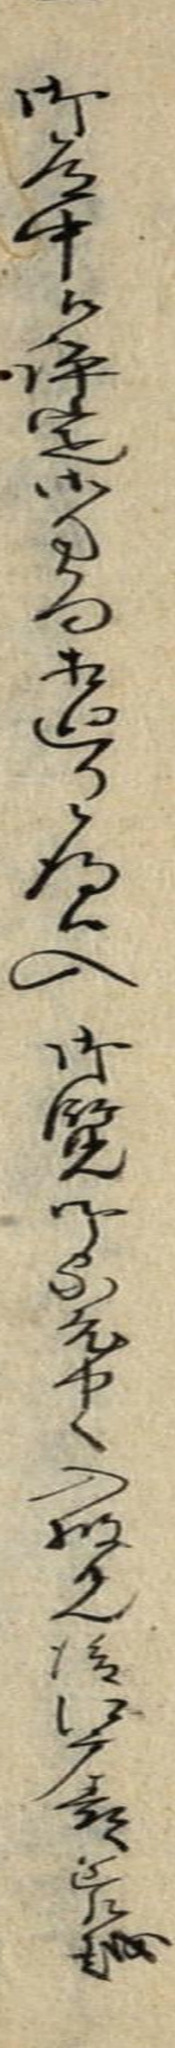一御道中江評定御用向相廻り候得は入御覧御家老中へ入披見後江戸表へ差越
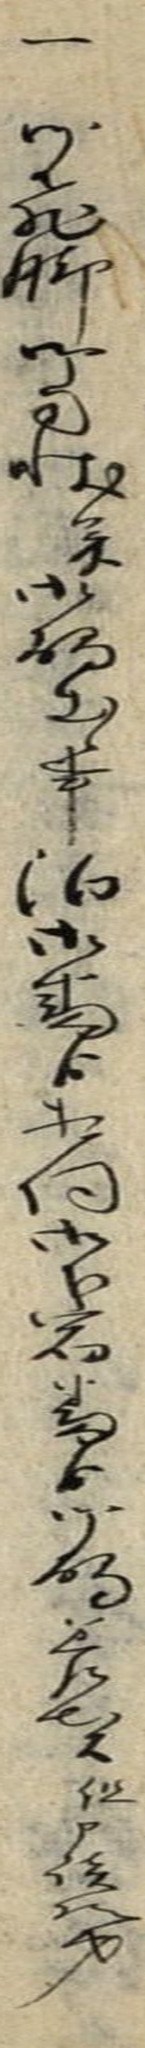一御飛脚御用状并御触出候事泊御番ゟ相伺御下宿番ゟ御触差出す但申談次第
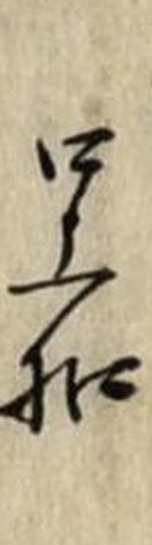口上扣
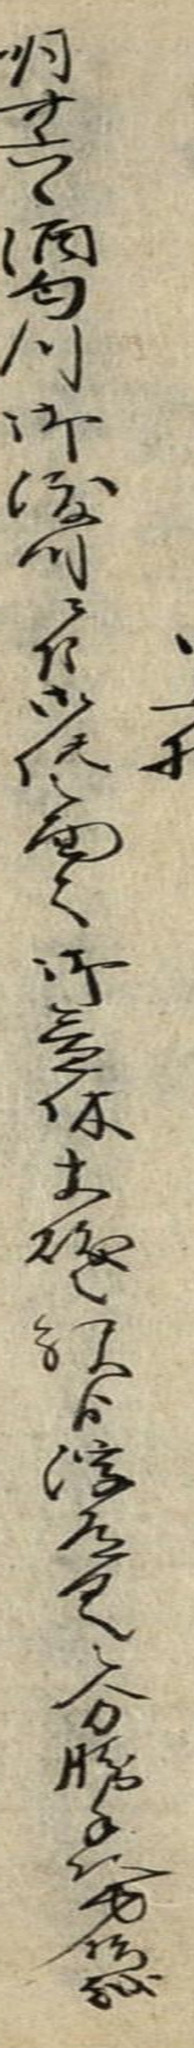明廿六日酒匂川御渡川に付御供之面々御昼休大磯之駅より浮道具之分勝手次第指越
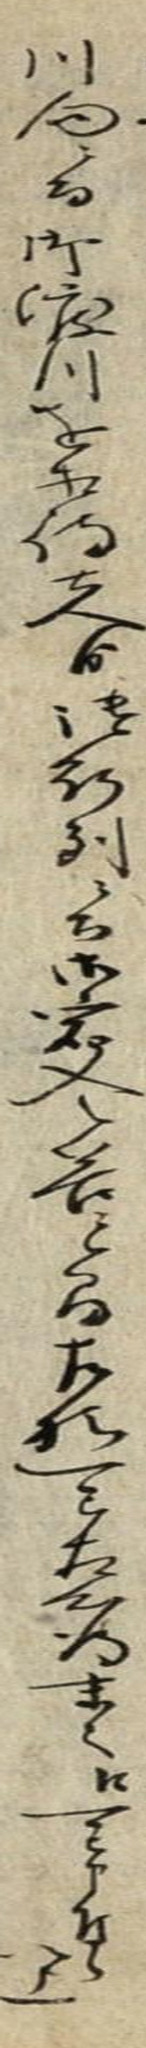川向にて御渡川を相待夫ゟ御行列にて御宿入之筈に候間左様可被相心得末々江可被申付候以上
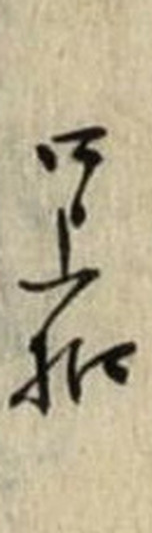口上扣
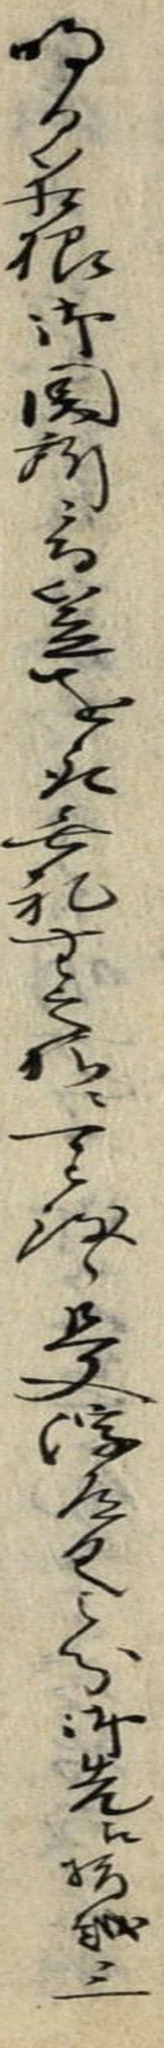明日箱根御関所にて笠を取無礼無之様に可被致候且又浮道具之分御先江指越三
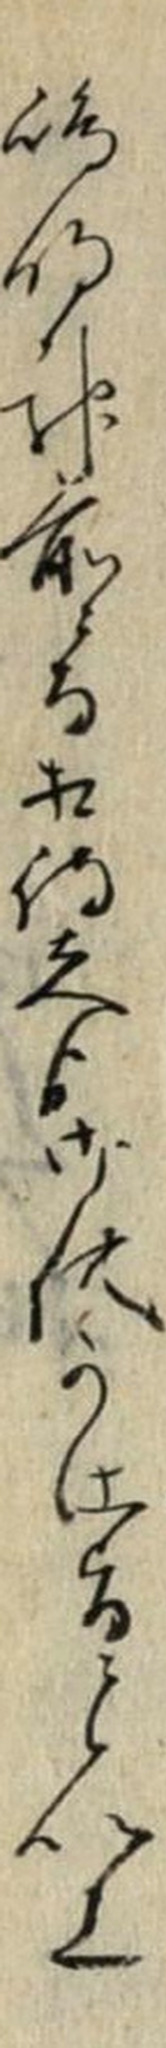嶋明神前にて相待夫ゟ御供可仕旨に候以上
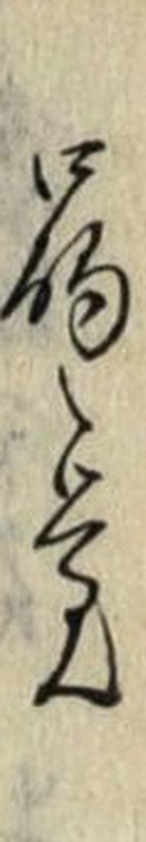口触之覚
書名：三都并道中之部
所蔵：福井県文書館 Fukui Prefectural Archives
